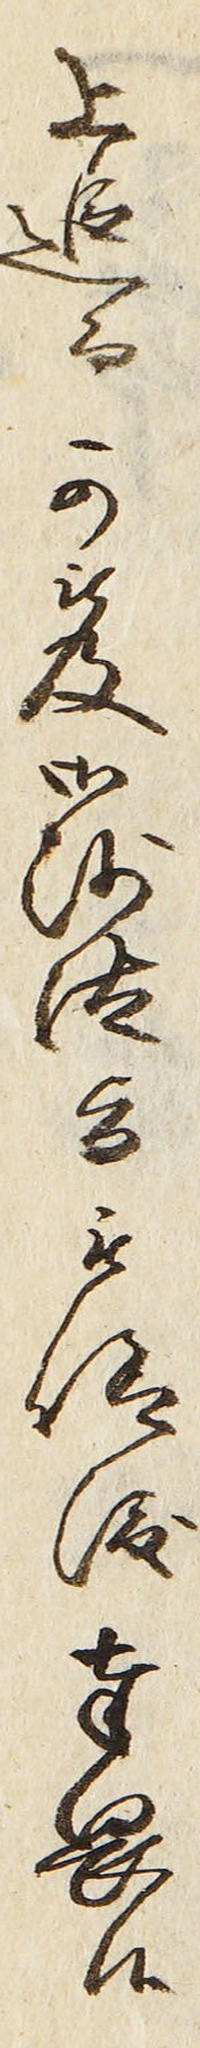上追而可被及御沙汰旨被仰渡奉畏候
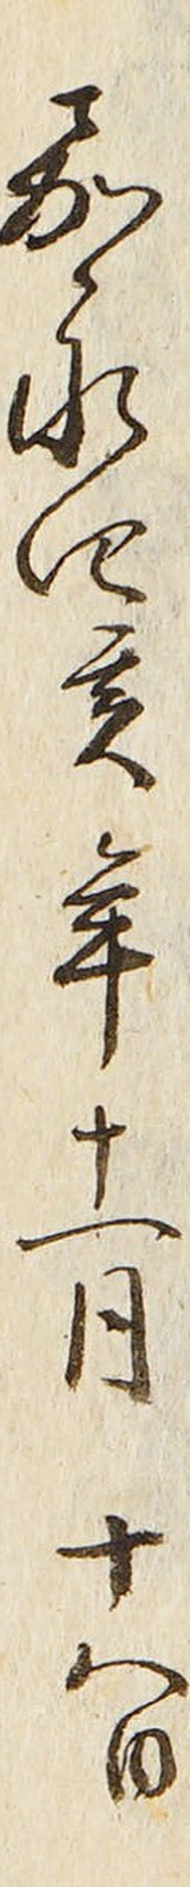嘉永四亥年十一月十八日
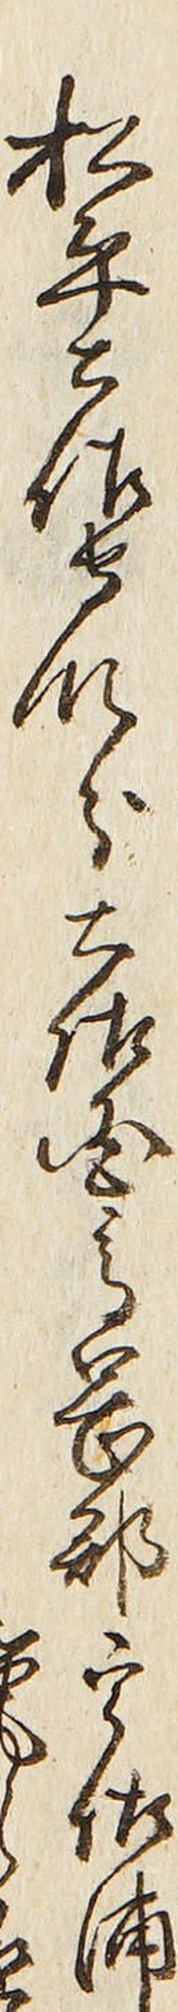松平土佐守領分土佐国高岡郡宇佐浦
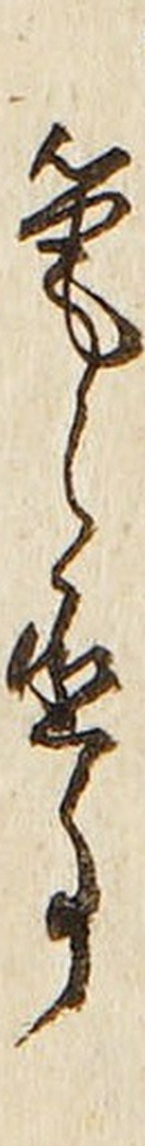筆之丞事
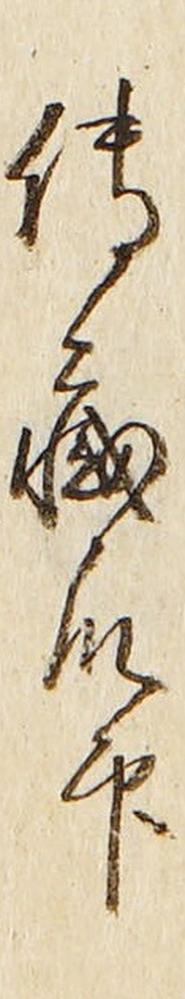伝蔵爪印
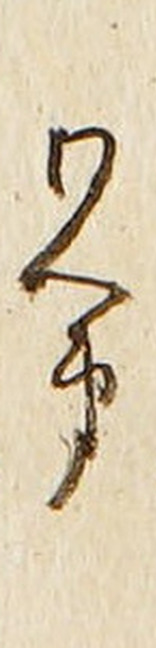同人弟
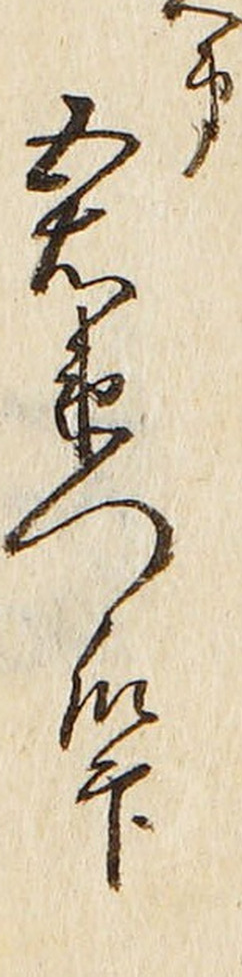五右衛門爪印
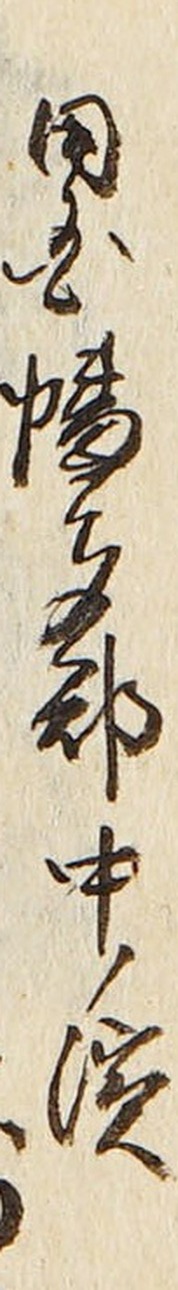同国幡多郡中ノ浜
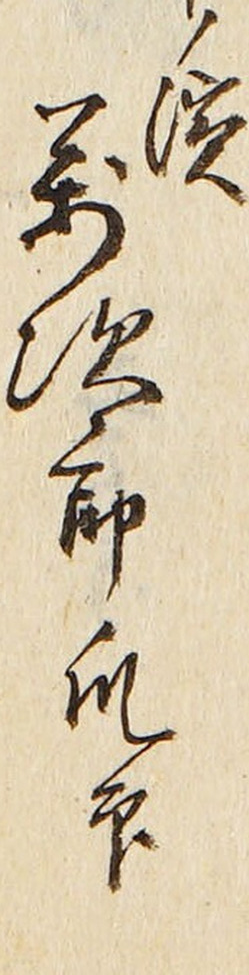万次郎爪印
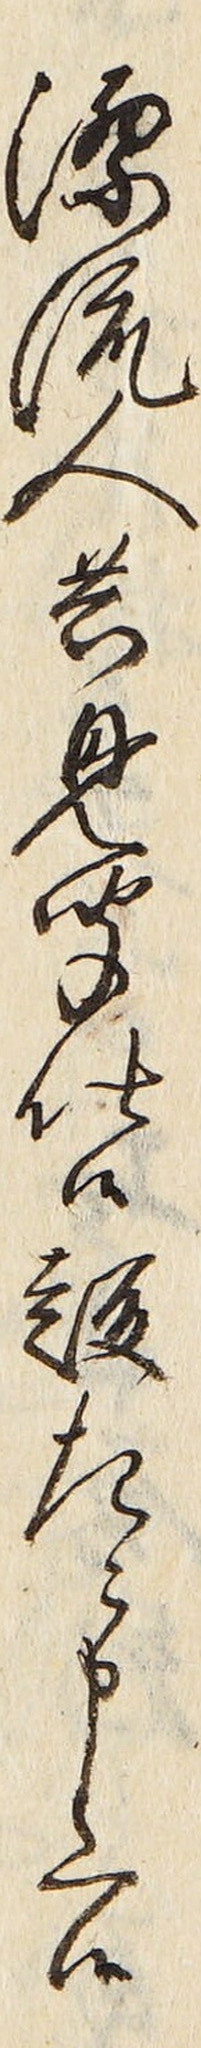漂流人共見聞仕候趣左申上候
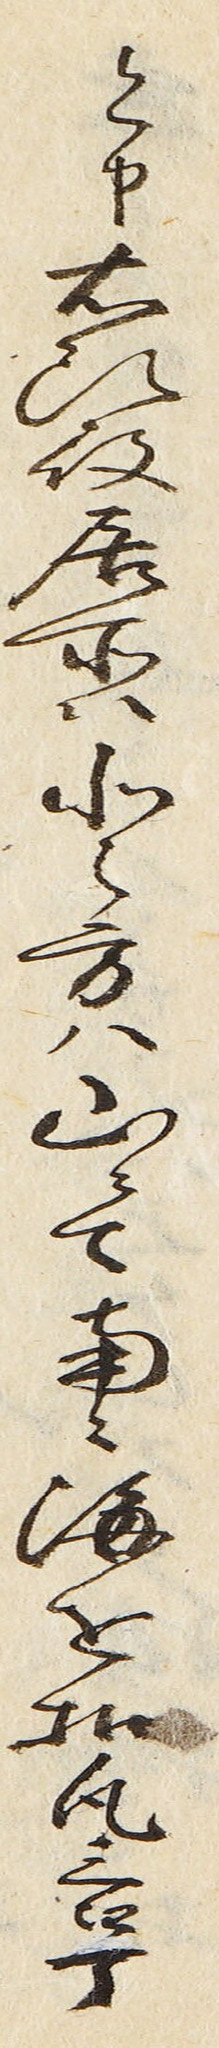と申右頭役居所は北之方は山にて南に海を扣凡三百丁
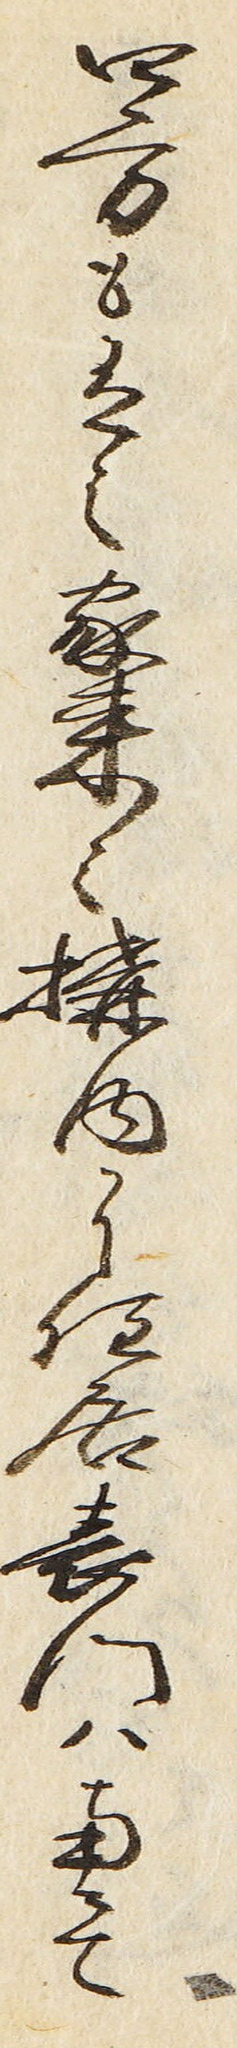四方も有之家来は構内に住居表門は南にて
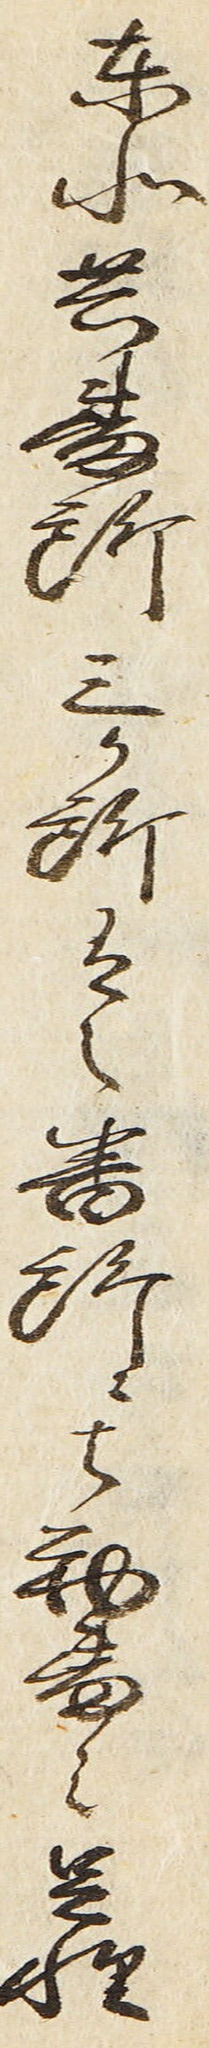東北共番所三ヶ所有之番所には勤番之足軽
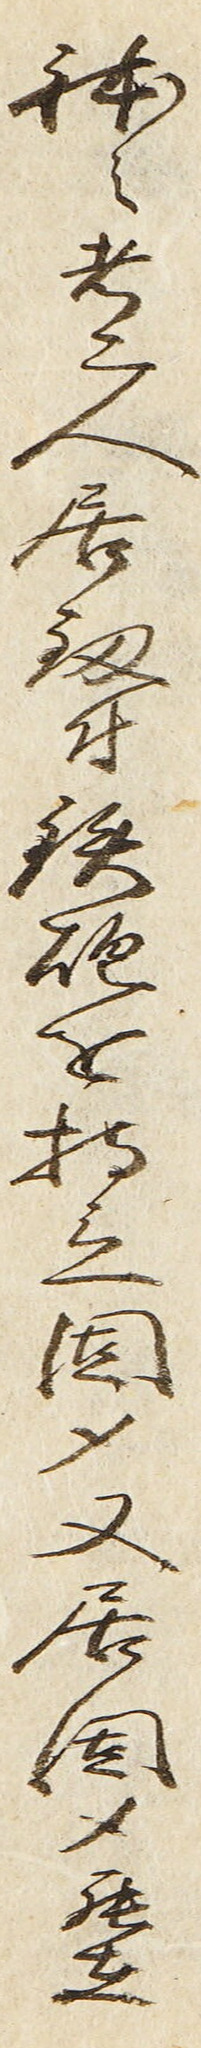躰之者二人居釼付鉄砲を持立固め又居固め罷在
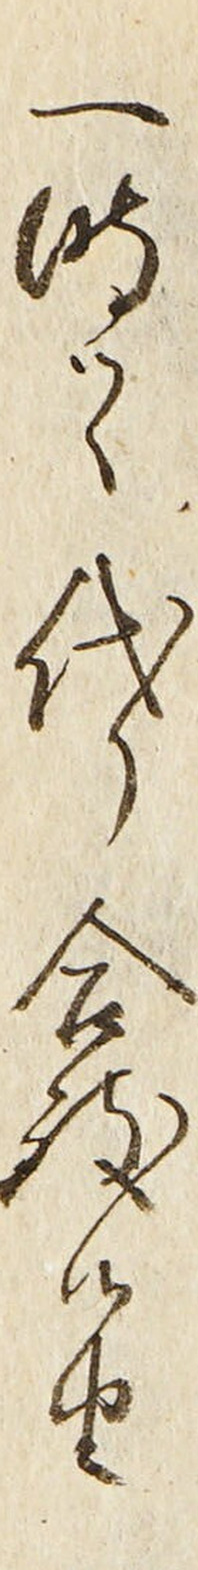一時ッヽ代り合致候由
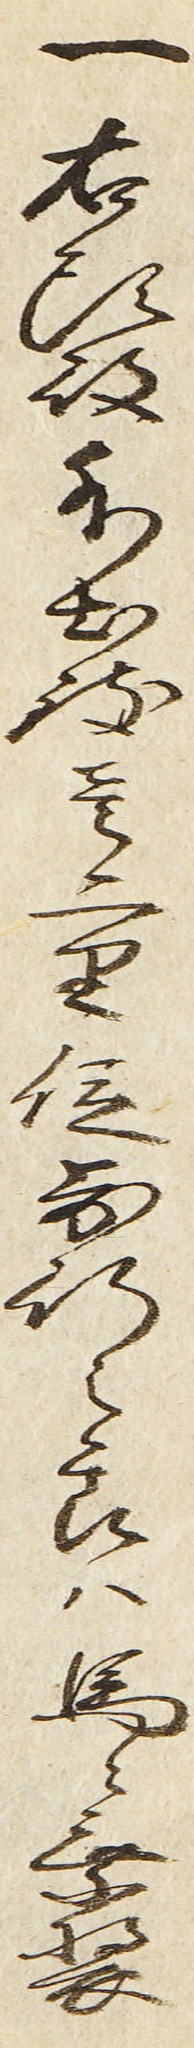一右頭役外出致壱二里位歩行之節は馬に乗装
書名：土佐中浜万次郎漂流記
